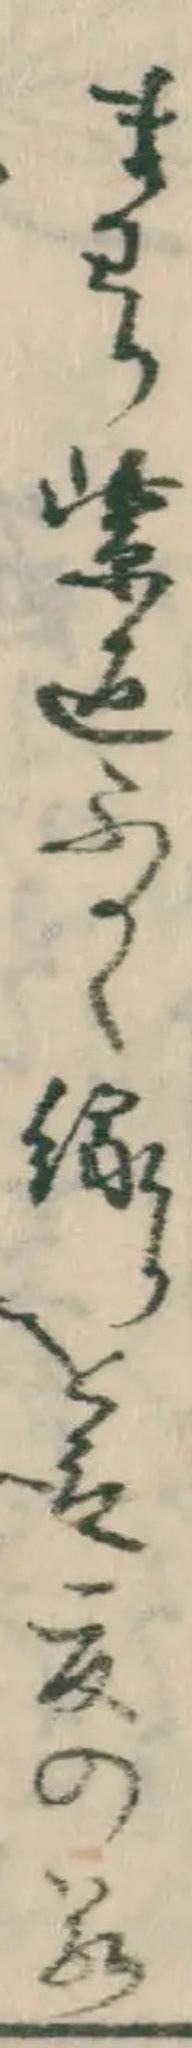まわり紫色ふかく縁りを取夏の若
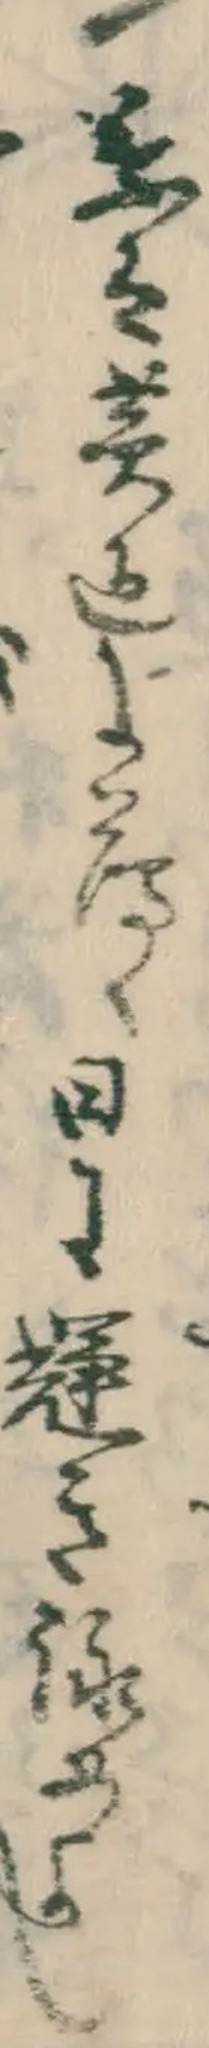葉は黄色に薄く日に輝き詠めよし
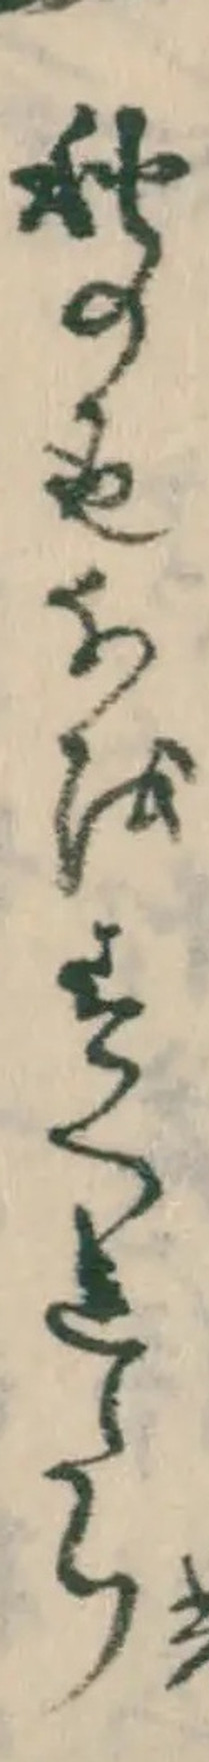秋の色なをすくれたり
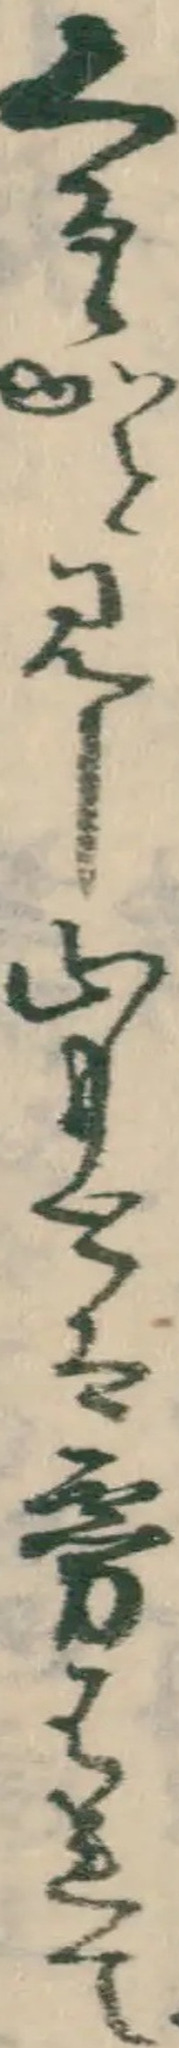くるゝかと見し山もとは霧はれて
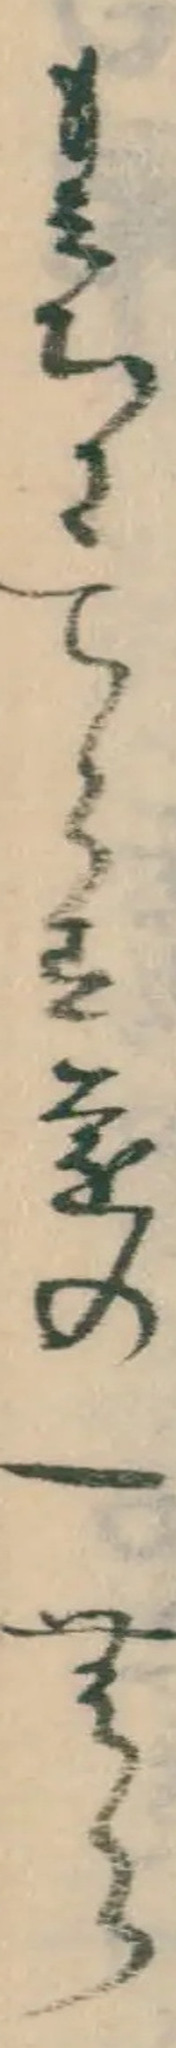もみちにてらす遠の一むら

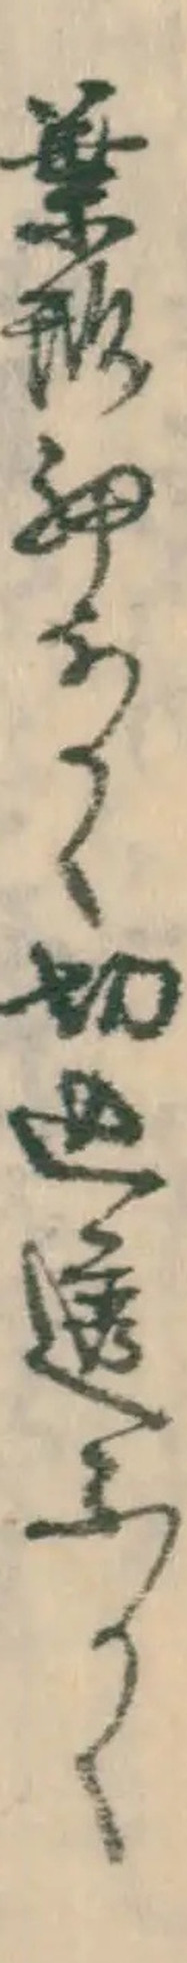釣錦葉形細なかく切込透ふかく
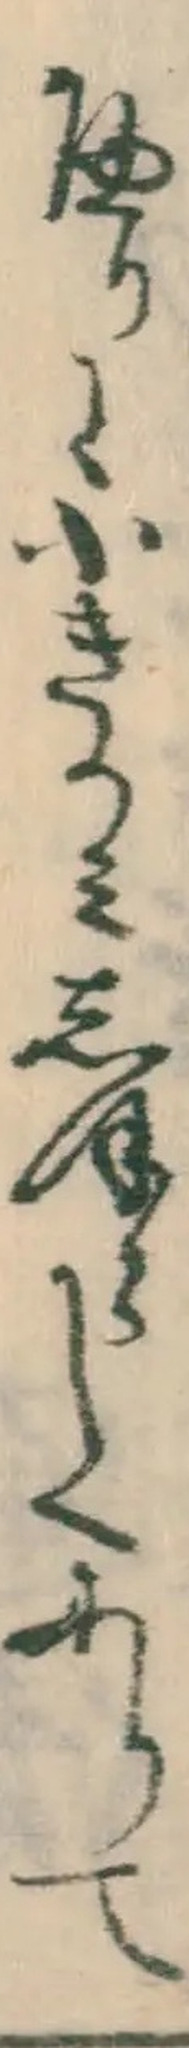へりに小きさみしほらしくありて
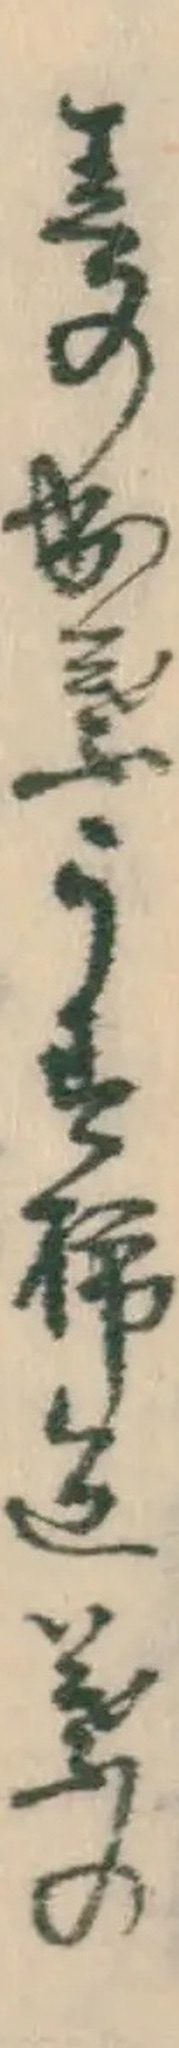春の出葉うす柿色葉の
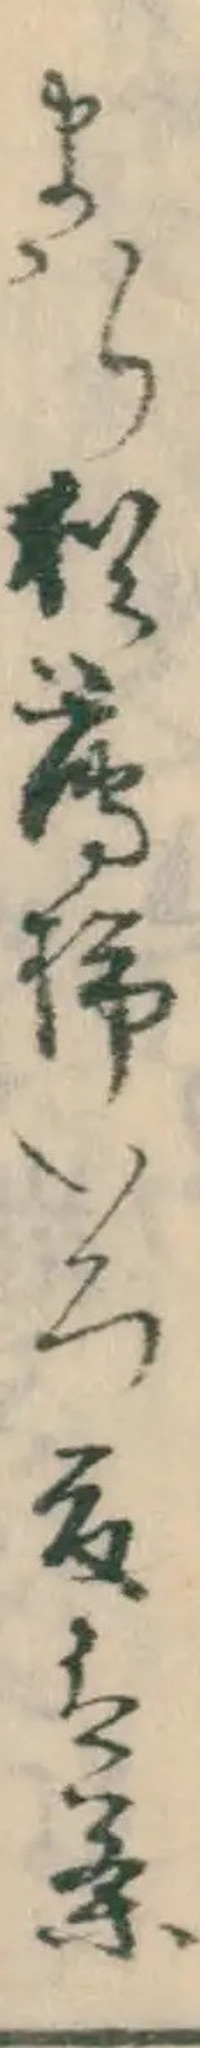まはり猶薄柿いろ夏は茶
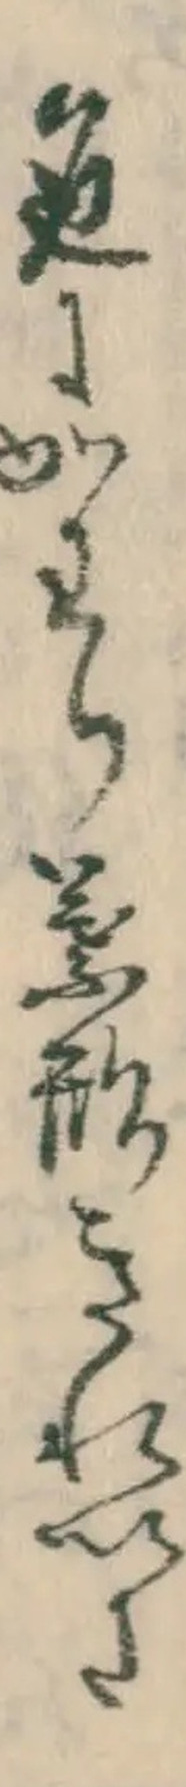色にかわり葉形きれいに
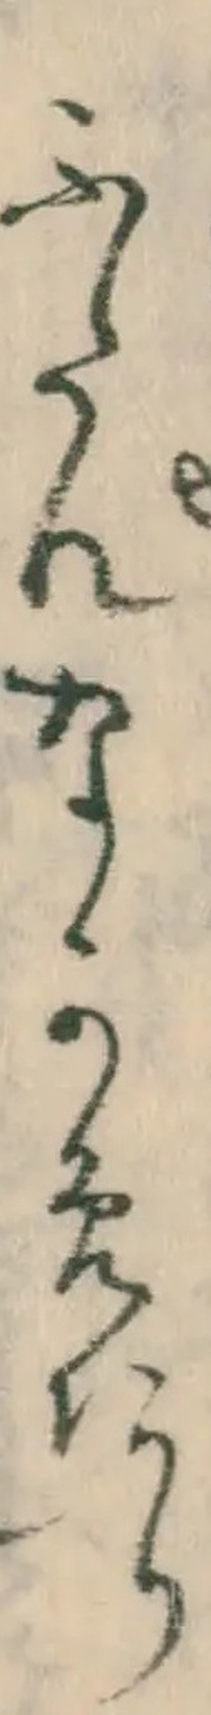ふたんなかめあり
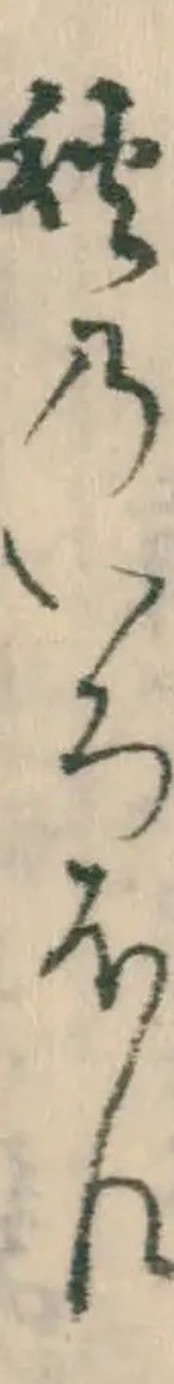秋のいろほん
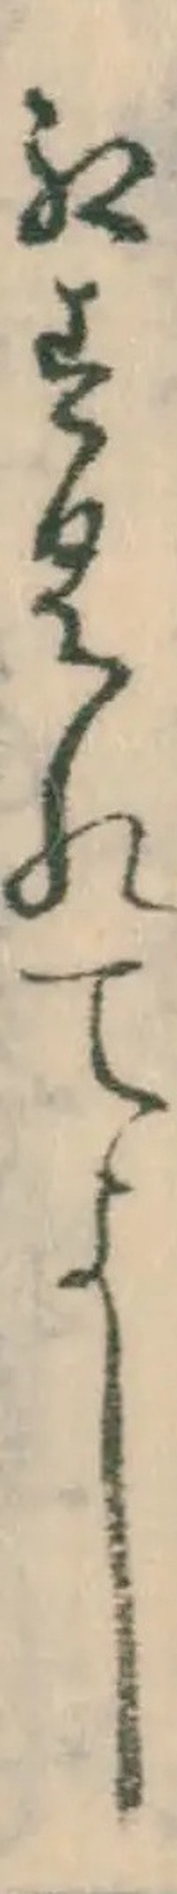紅すくれてよし
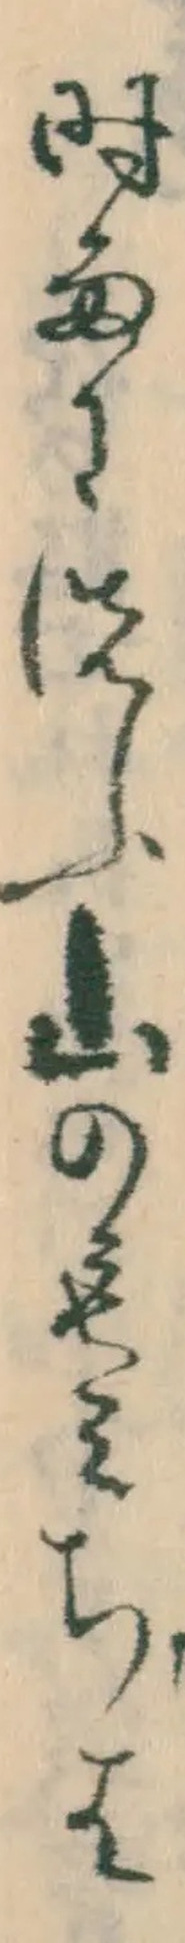時雨に洗ふ山のもみちは
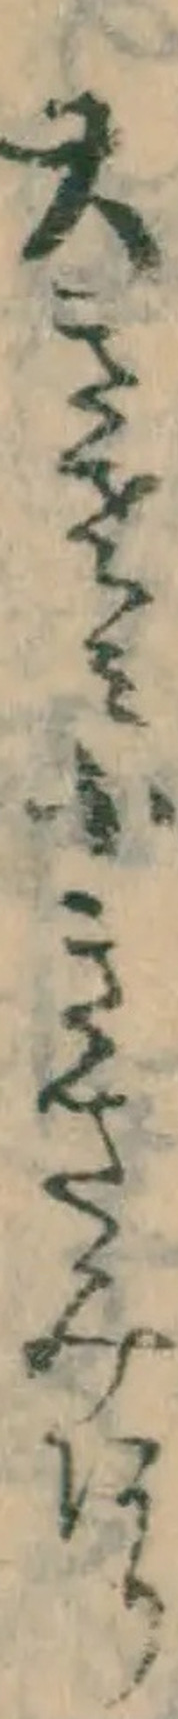大きさみ小きさみあり
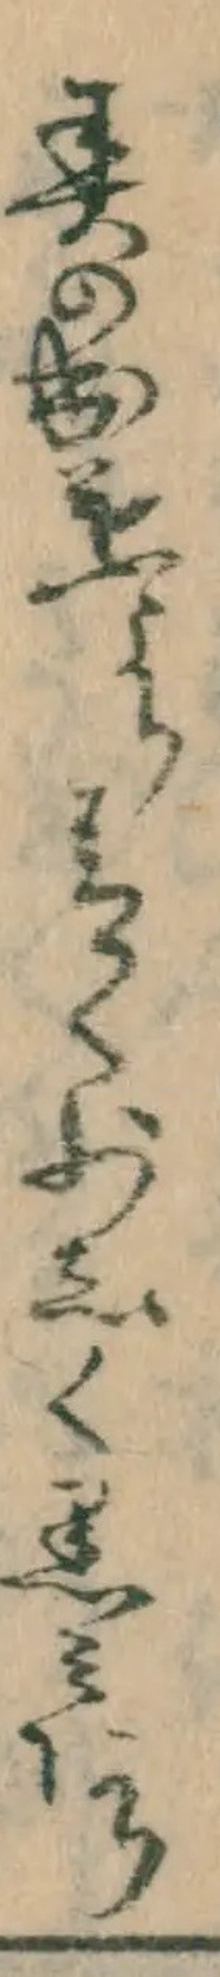夏の出葉より青く少しく黒みあり
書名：紅葉集
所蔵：国立国会図書館 National Diet Library, JAPAN
